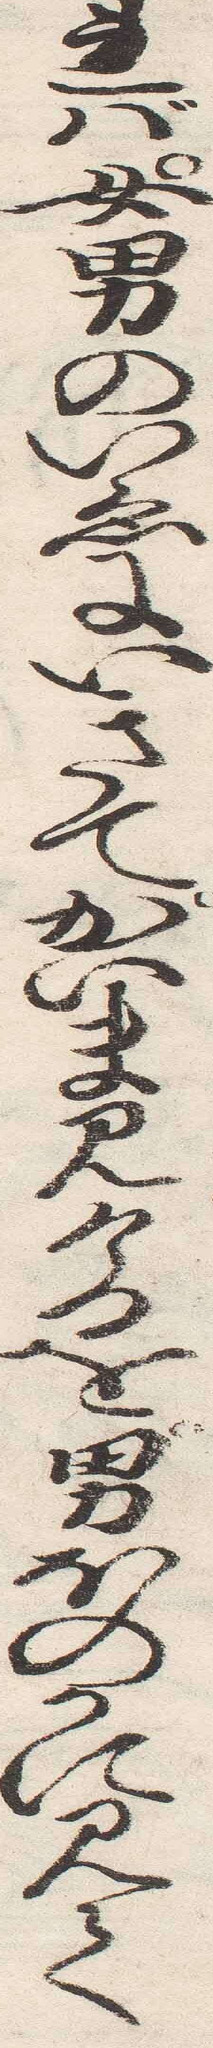れば。女男のいゑにいきて。かいま見けるを。男ほのかに見て
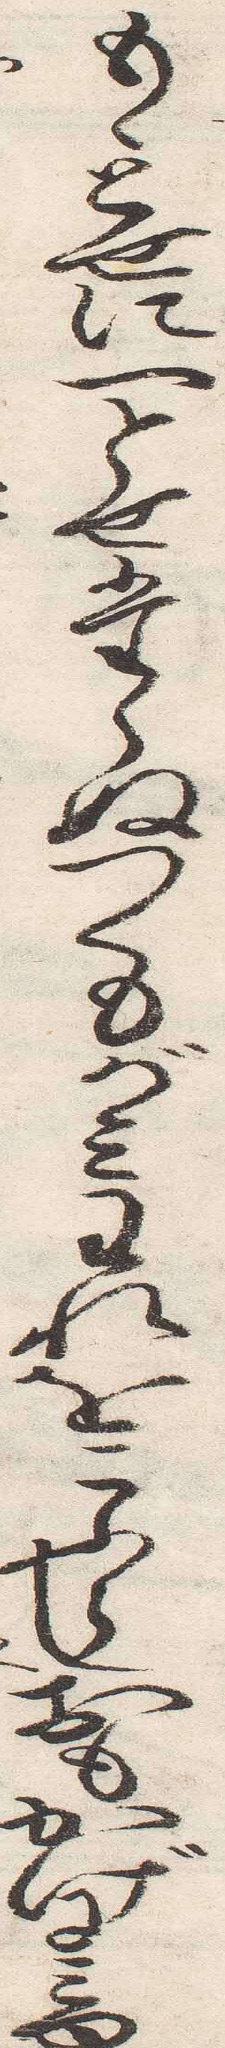もゝとせに一とせたらぬつくもがみわれをこふらしおもかげにみゆ
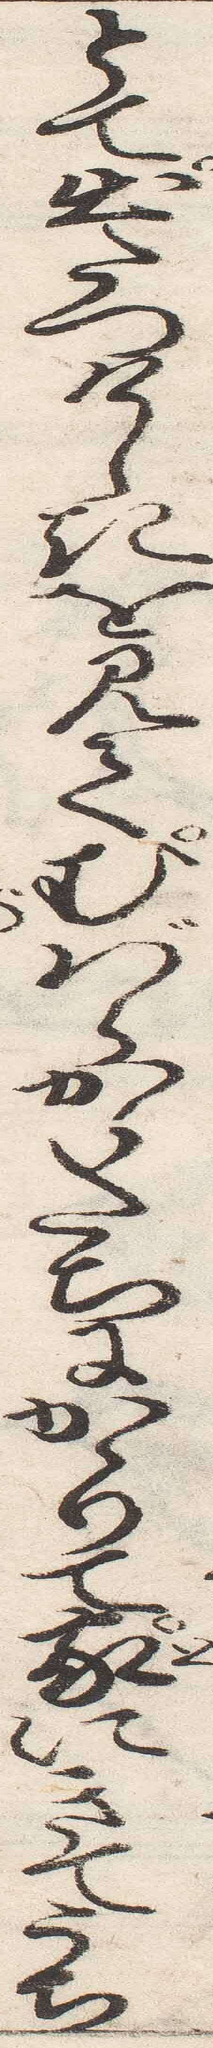とて。出たつけしきを見て。むばらからたちにかゝりて。家にきてうち
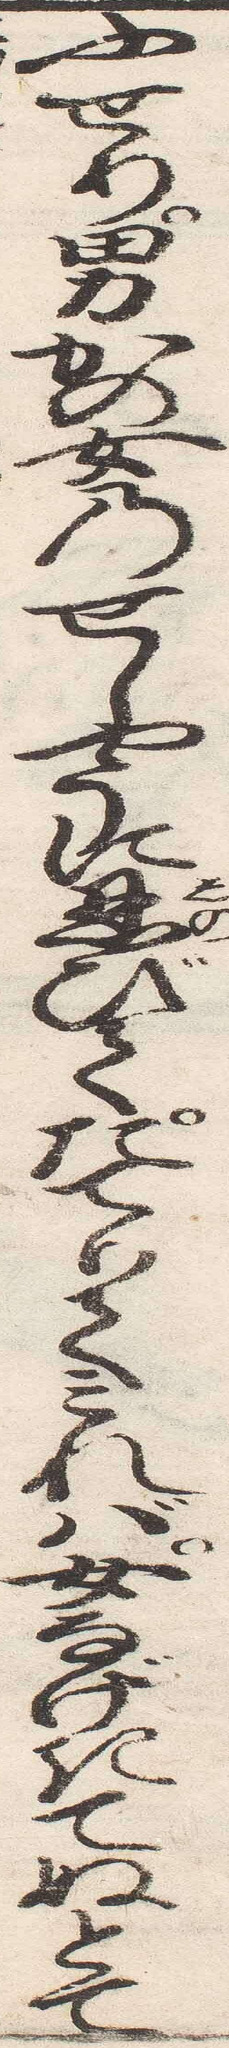ふせり。男かの女のせしやうに忍びて。たてりてみれば。女なげきてぬとて
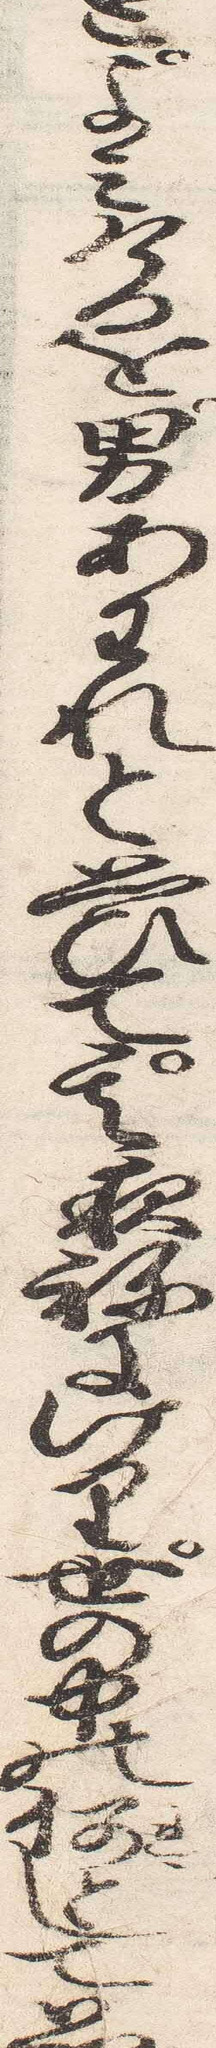と。よみけるを。男あわれと思ひて。其夜ねにけり。世の中の例として思
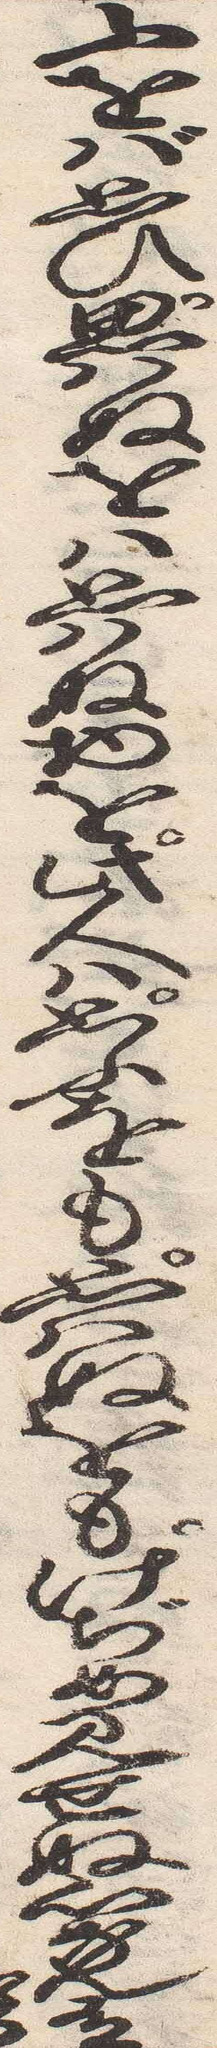ふをば思ひ。思はぬをは思はぬ物を。此人は。思ふをも。思はぬをも。けぢめ見せぬ心なん有ける
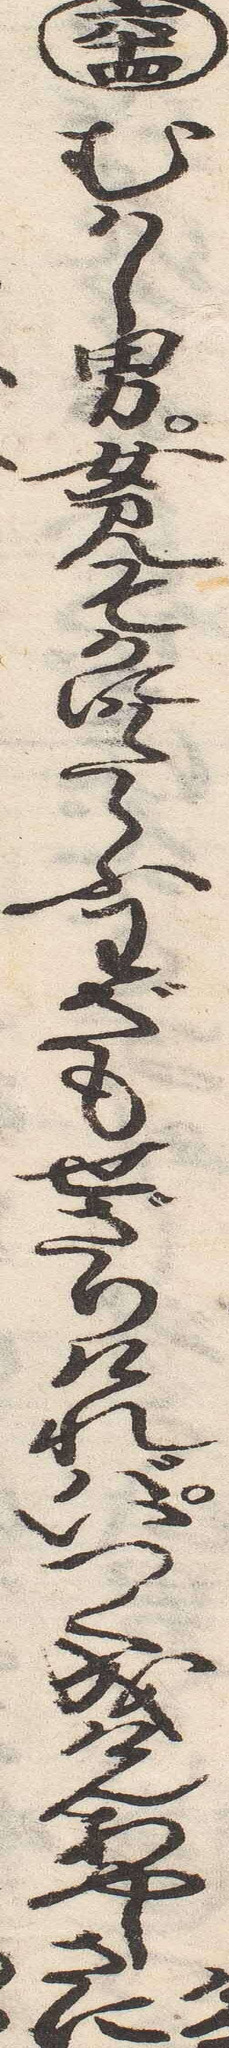六十四むかし男。女みそかにかたらふわざもせざりければ。いつく成けんあやしさによめる
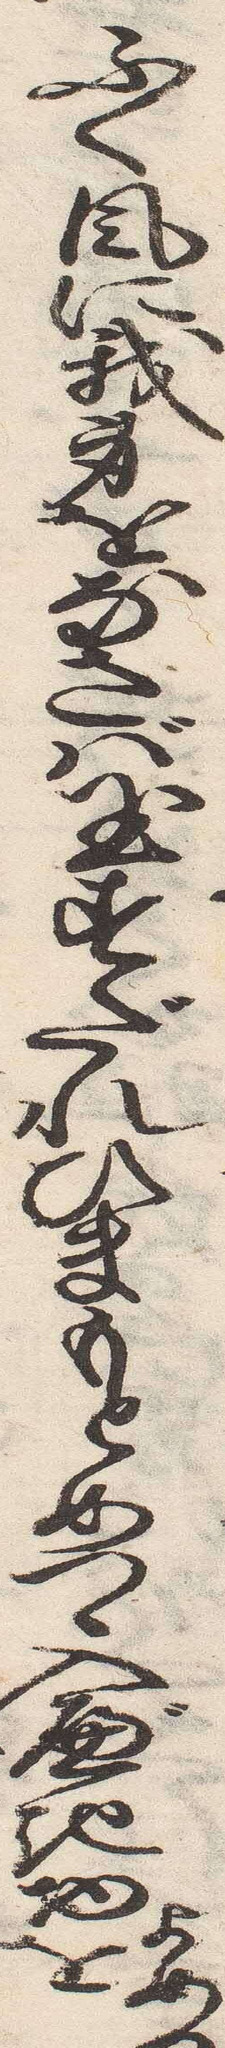ふく風に我身をなさば玉すだれひまもとめつゝ入べき物を
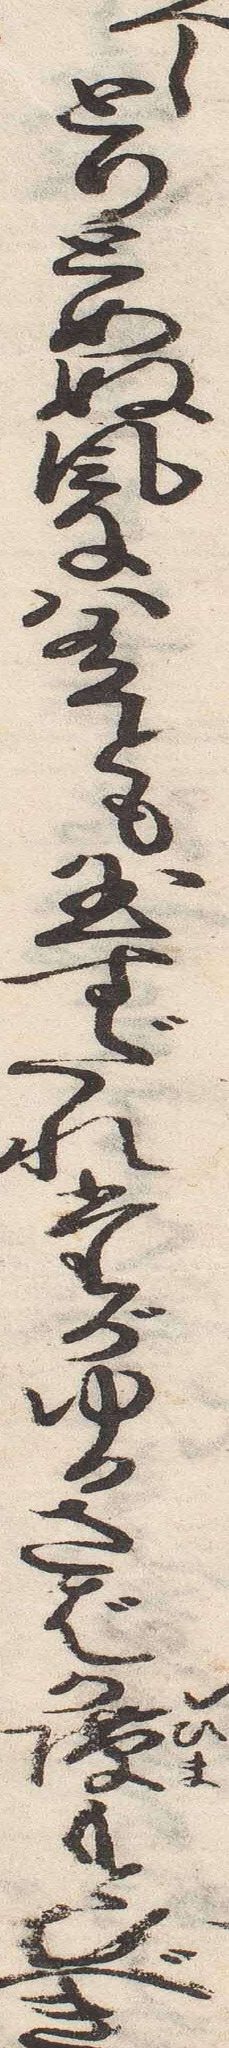とりとめぬ風には有とも玉すだれたがゆるさばか隙もとむべき
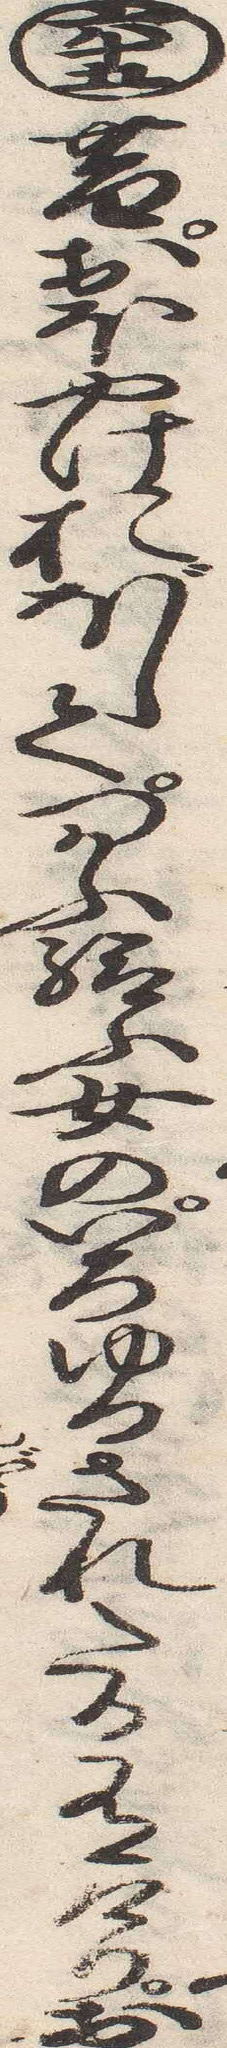六十五昔。おほやけおぼして。つかふ給ふ女の。いろゆるされたる有けり。お
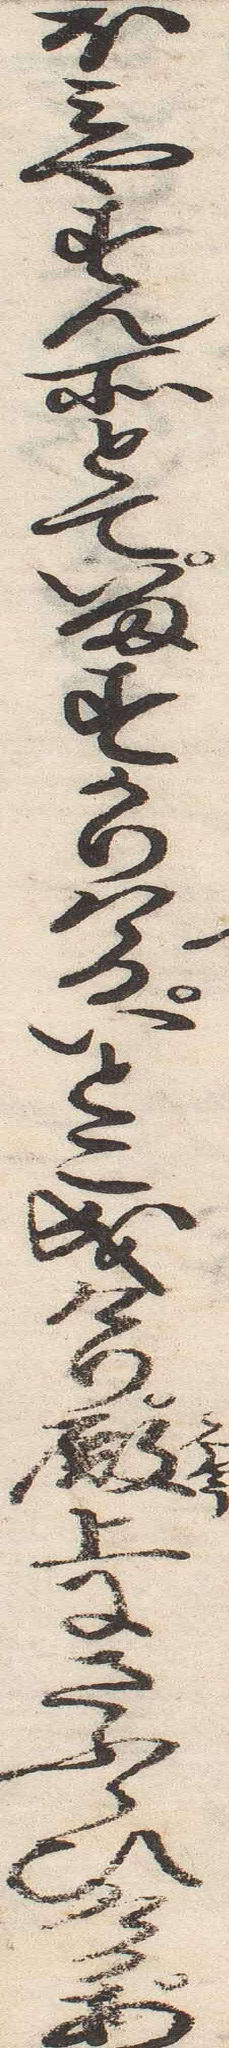ほみやすん所とて。いますかりける。いとこ成けり。殿上にさふらひける。あ
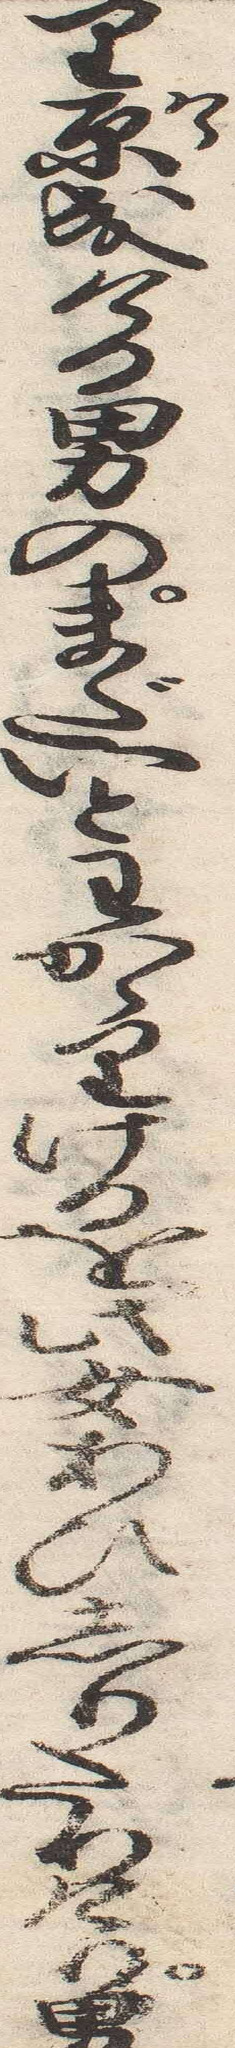り原成ける男の。まだいとわかゝりけるを此女あひしりたりけり。男
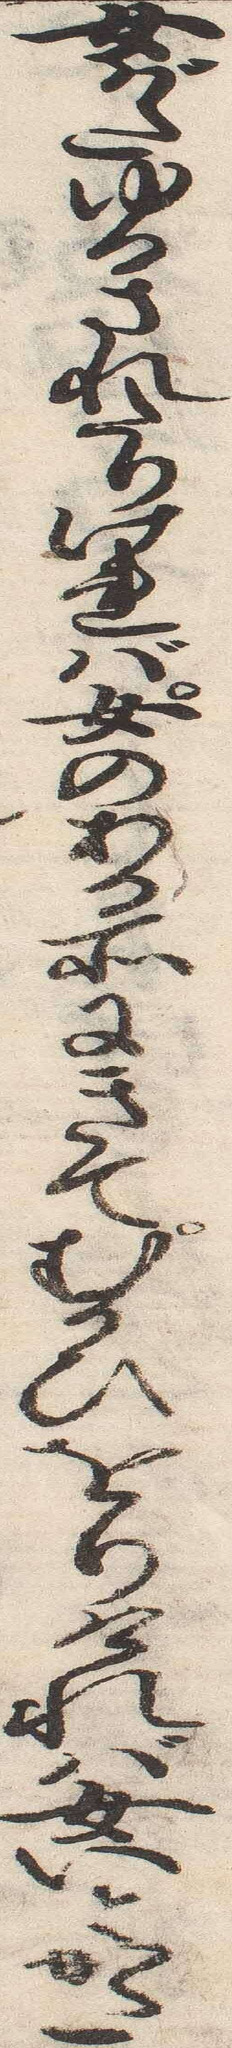女がたゆるされたりければ。女のある所にきて。むかひをりければ女いとかた
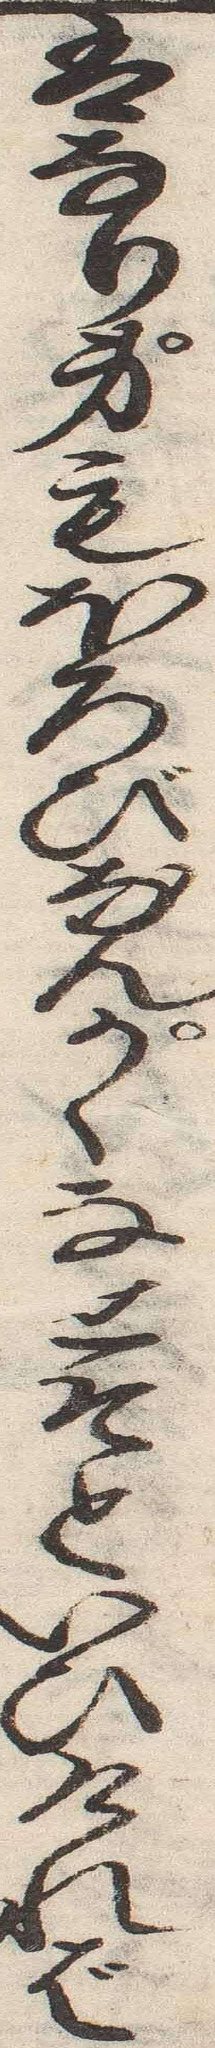はなり。身もほろびなん。かくなせそといひければ
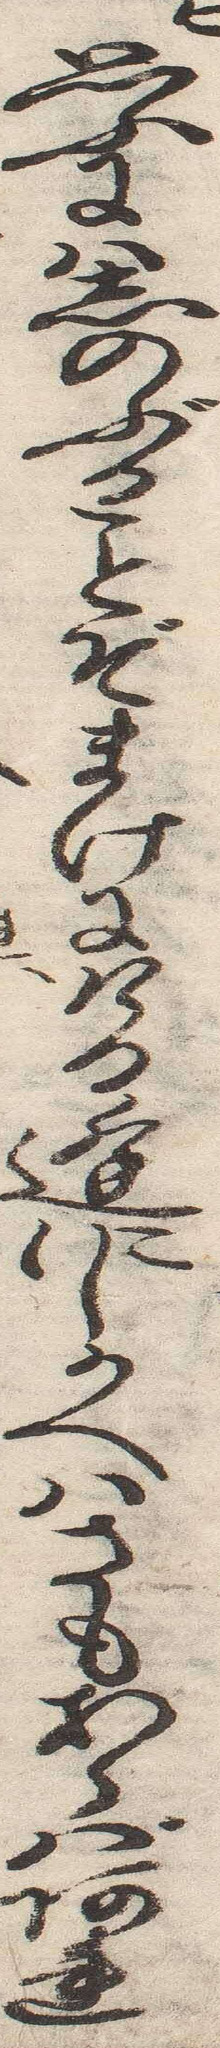新古今思ふにはしのぶることぞまけにける逢にしかへはさもあらばあれ
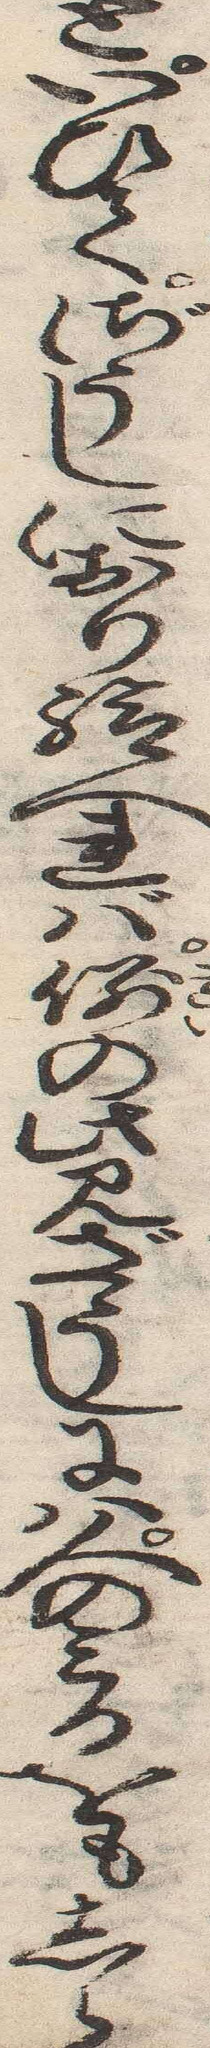と。いひて。ざうしにおり給へれば。例の此みざうしには。人のみるをもしら
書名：伊勢物語
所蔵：東京学芸大学附属図書館 国文学研究資料館
